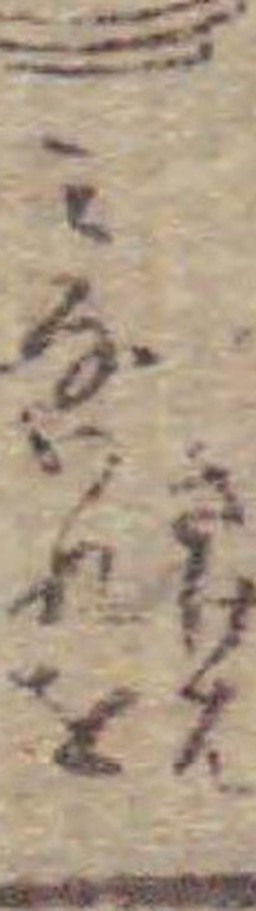みなわれを
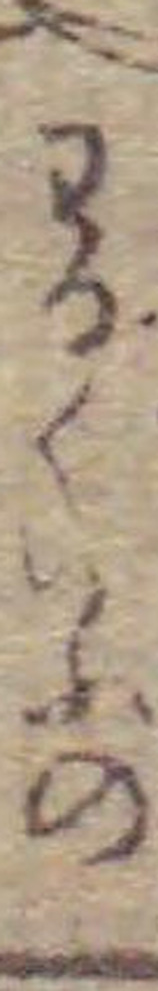わるくいふの
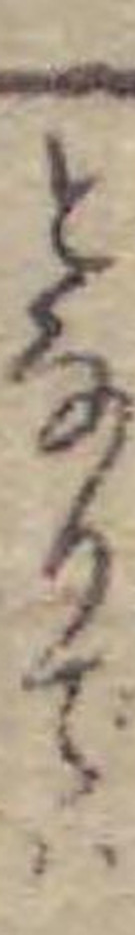となりでは
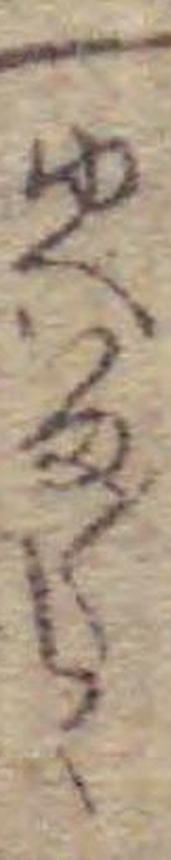ゆへいま〳〵しく
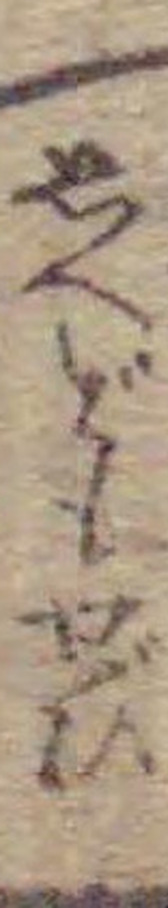思へどもぜひ
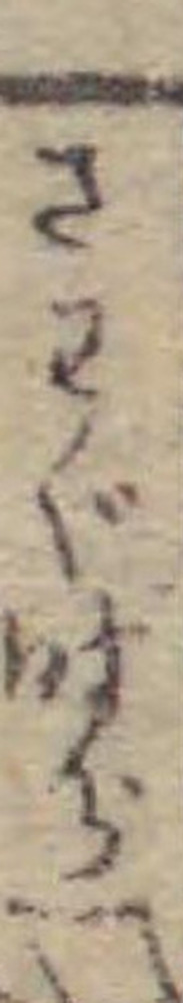さわぐ時分
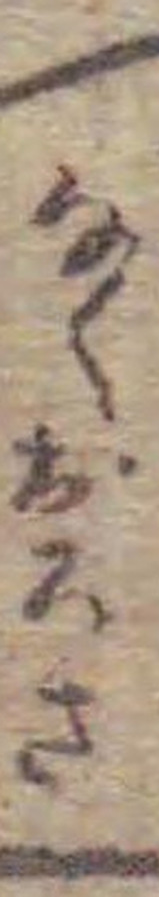なくおろさ
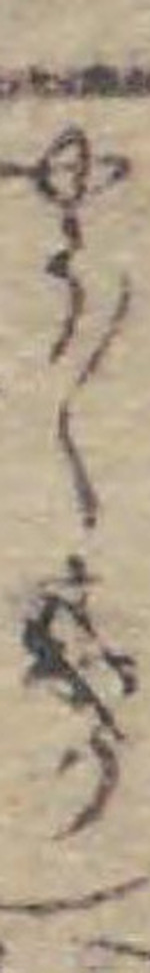やう〳〵来り
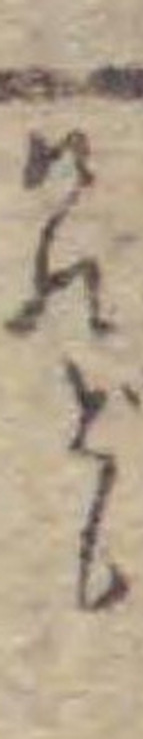けれども
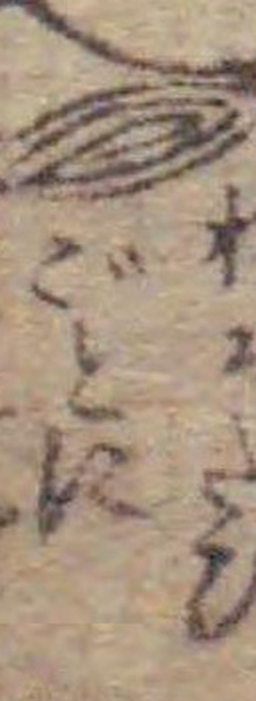ごとに
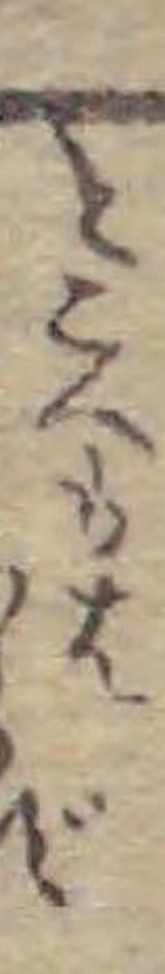とこへもは
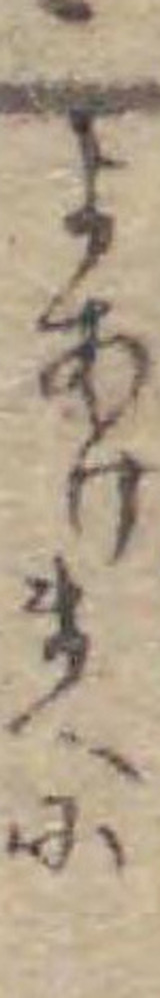よあけまへに
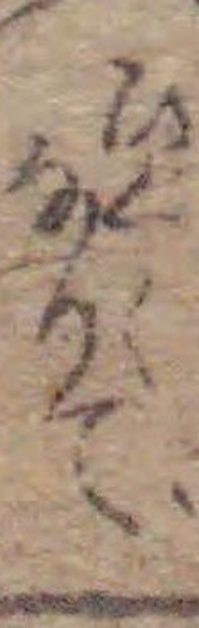なりて
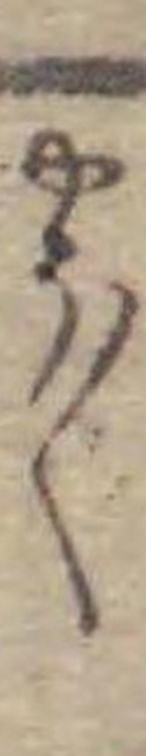やう〳〵
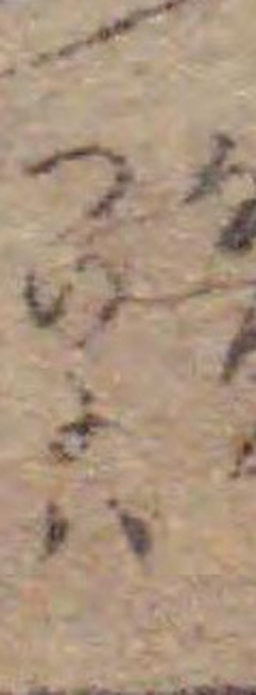ついには
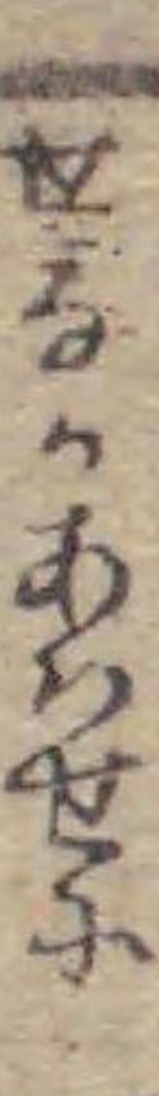せなかあはせに
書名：鼻峰高慢男 : 2巻
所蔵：国立国会図書館 National Diet Library, JAPAN
